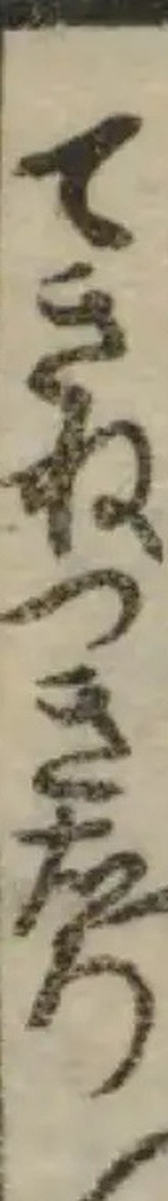てきねつき右衛門
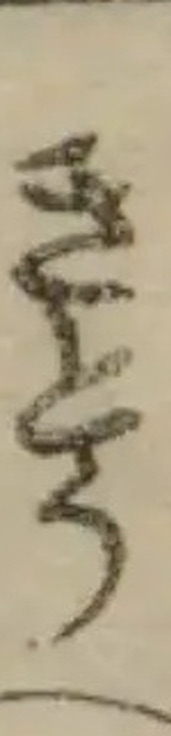きとう
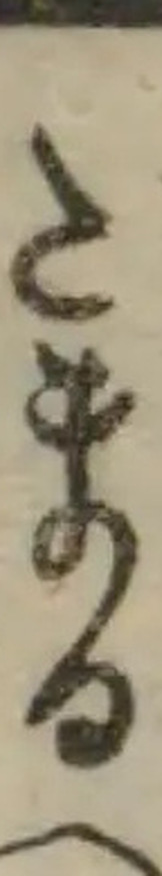たまる
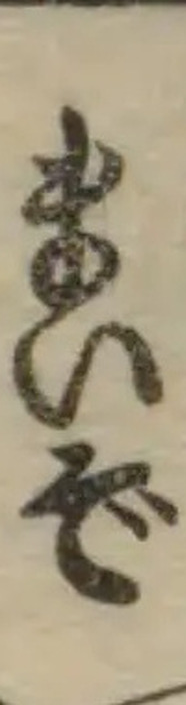まいぞ
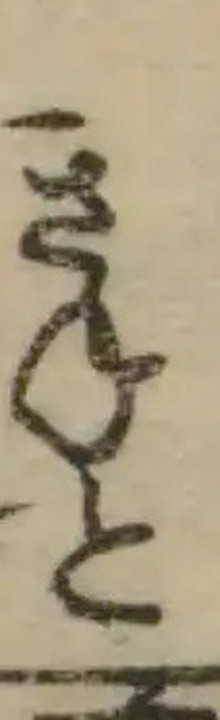きねと

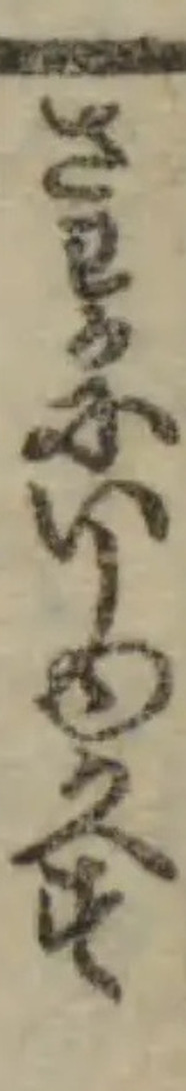さわかにいしゆかへす
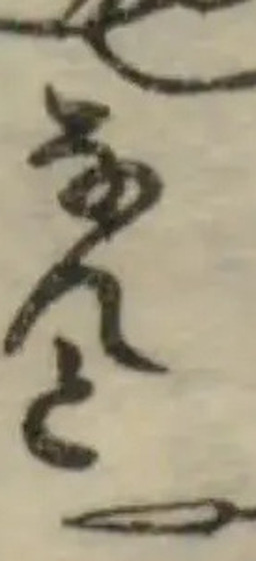なんと
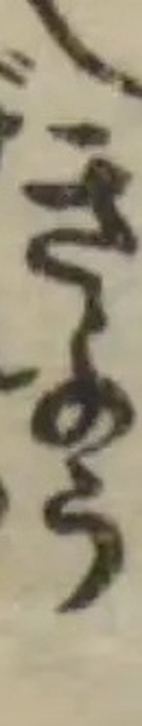きよう
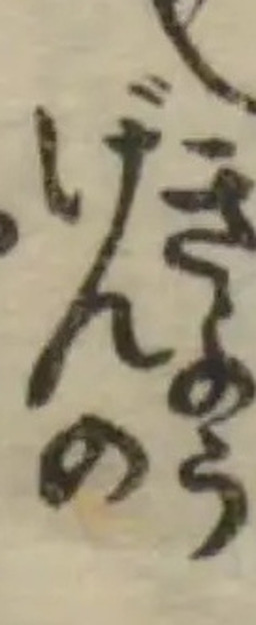げんの
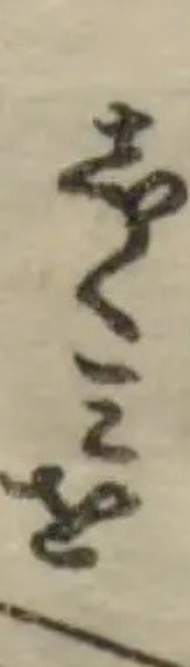しくみを
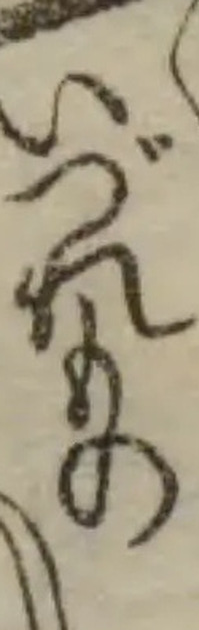いづれもの
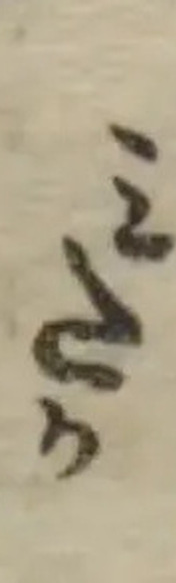みたか
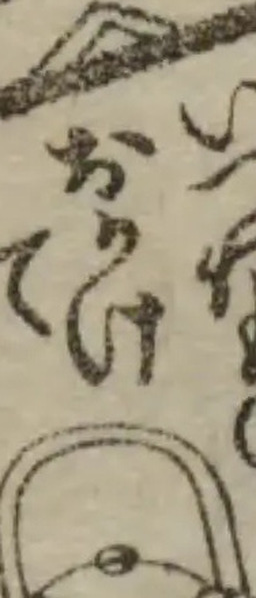おかけ
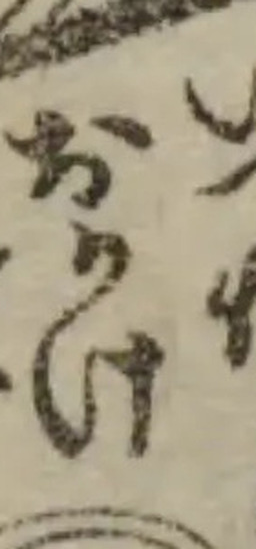おかけ
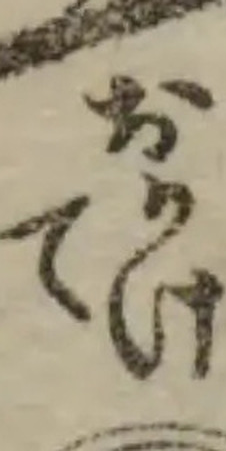おかけ
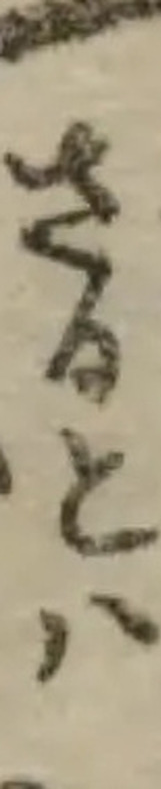さるとは
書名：さるかに合戦
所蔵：国立国会図書館 National Diet Library, JAPAN
